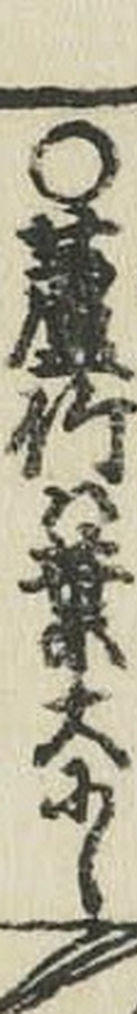○蘆竹は葉大にし
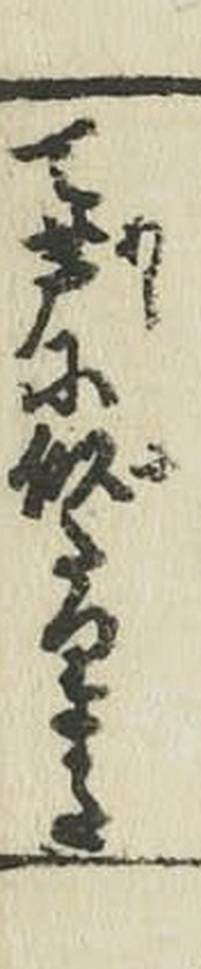て芦に似たるまた
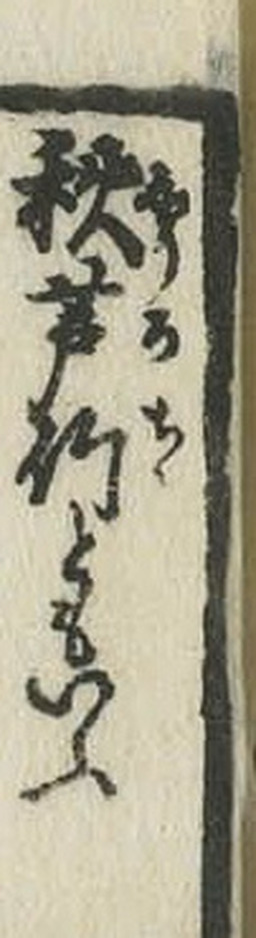秋芦竹ともいふ
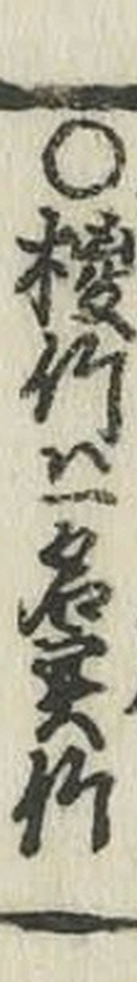○棕竹は一名実竹
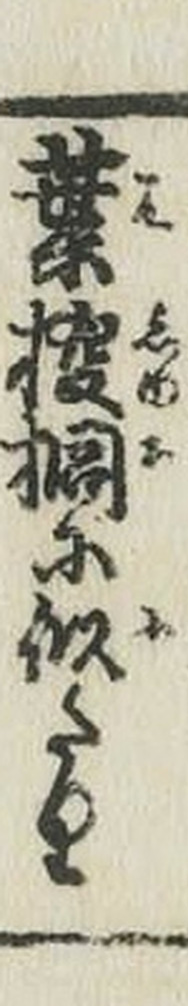葉棕櫚に似たり
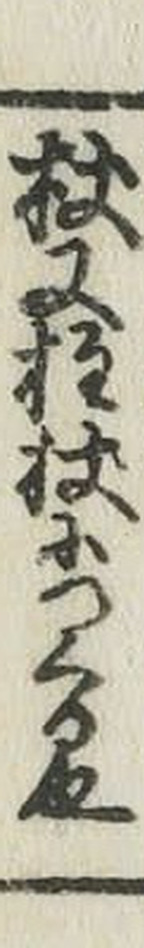杖又拄杖につくる也
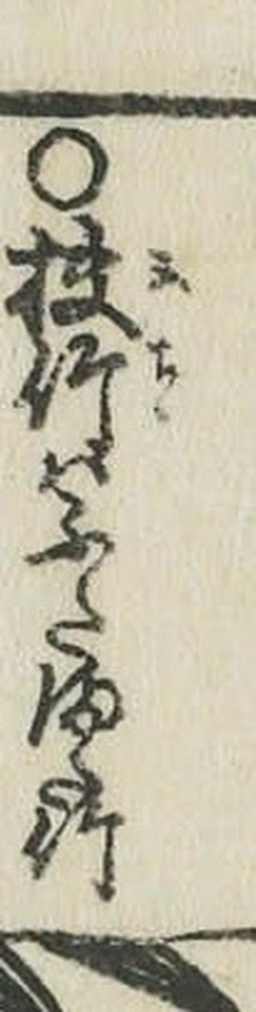○扶竹はふたまた竹
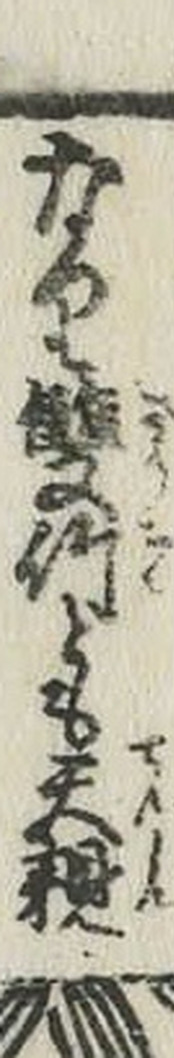なり双竹とも天親
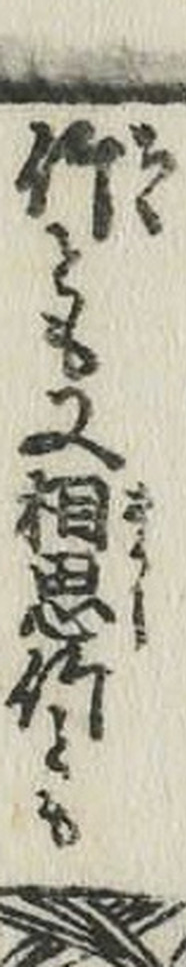竹とも又相思竹とも
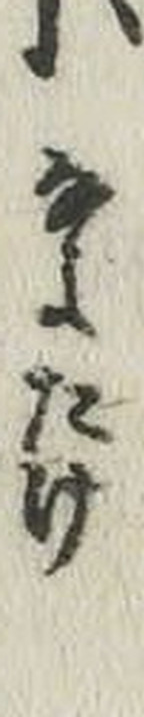なよたけ
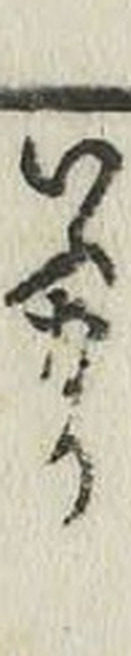いふなり
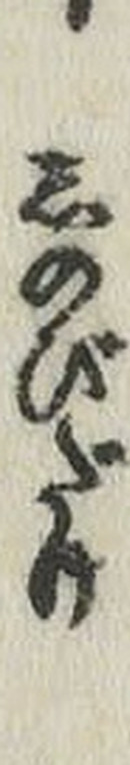しのびだけ
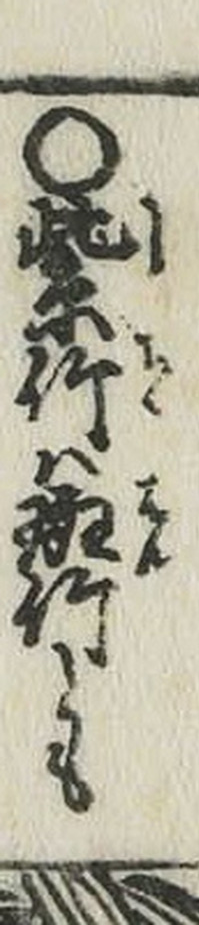○紫竹は斑竹とも
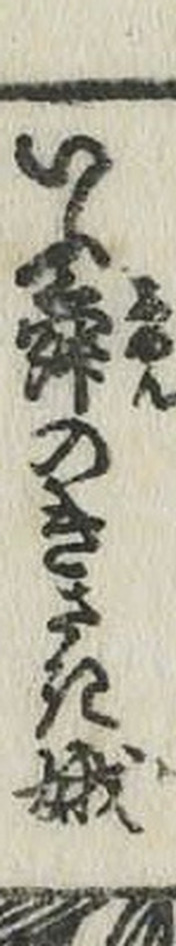いふ舜のきさき娥
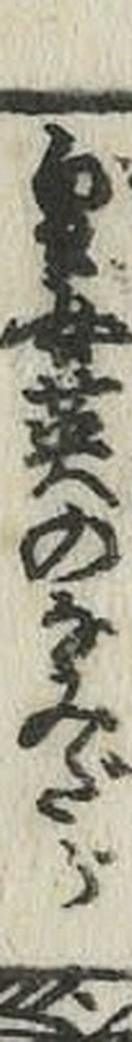皇女英のなみだが
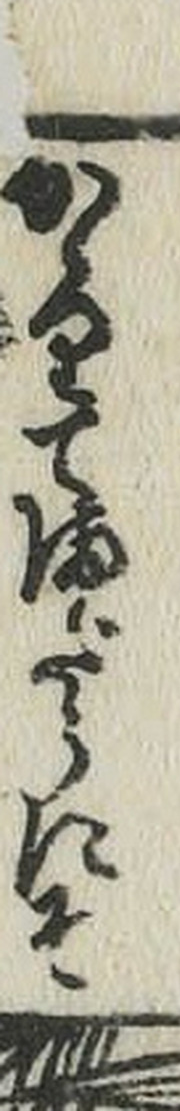かゝりてまだらにそ
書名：増補頭書訓蒙図彙大成 10巻 8:巻之17-19
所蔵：東京学芸大学教育コンテンツアーカイブ
